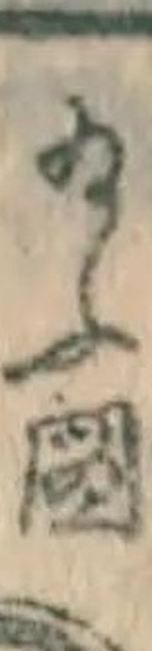給ふ図
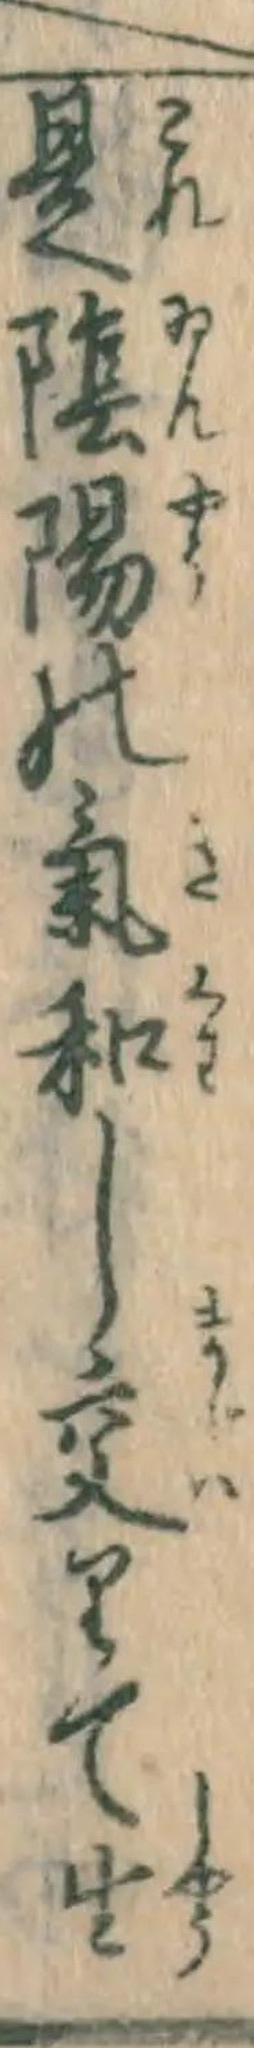是陰陽の気和し交りて生
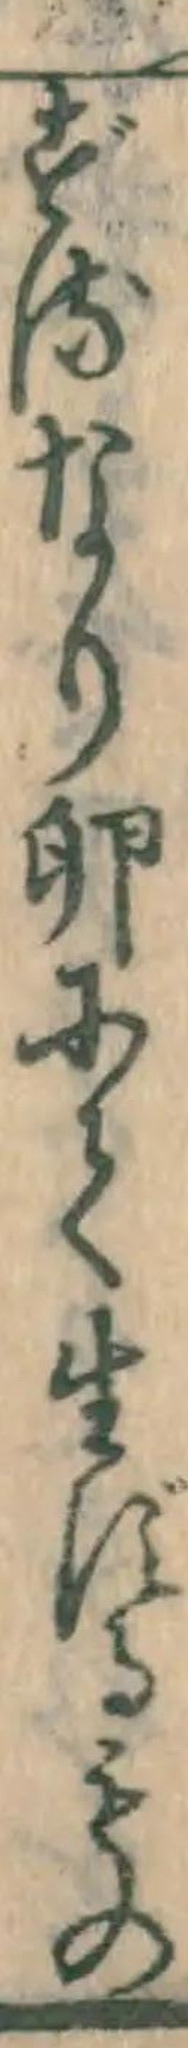ずるなり卵にて生ずるもの
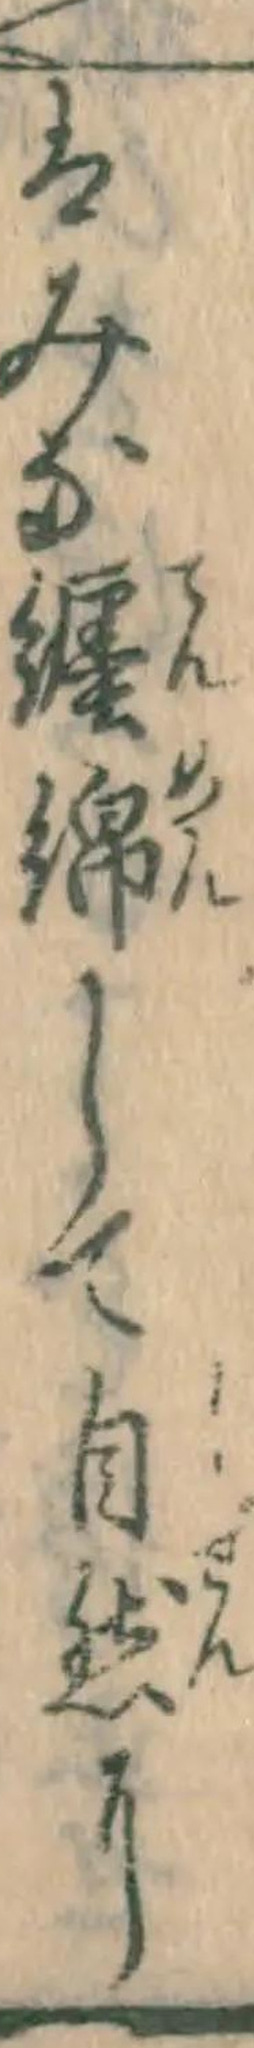はみな纏綿して自然に
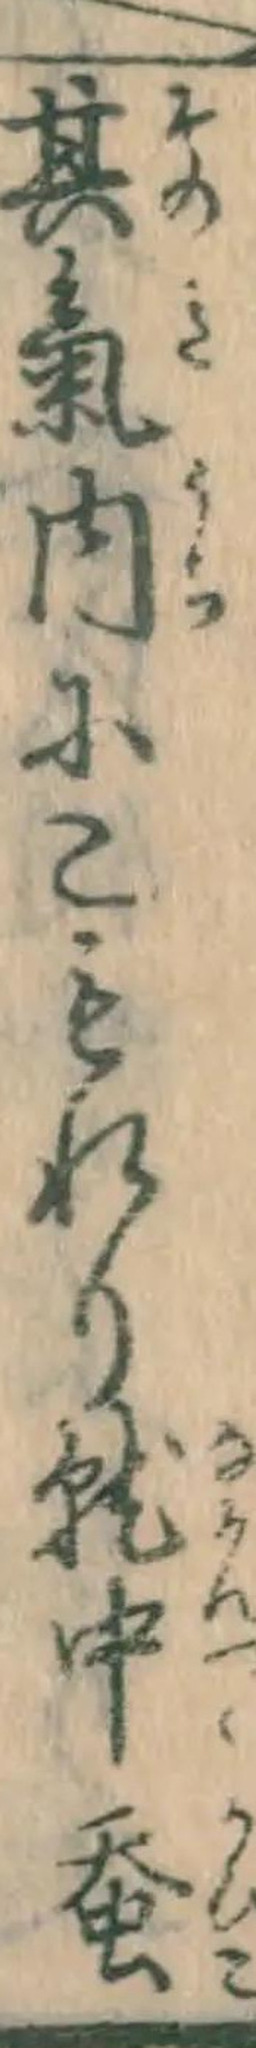其気内にこもれり就中蚕
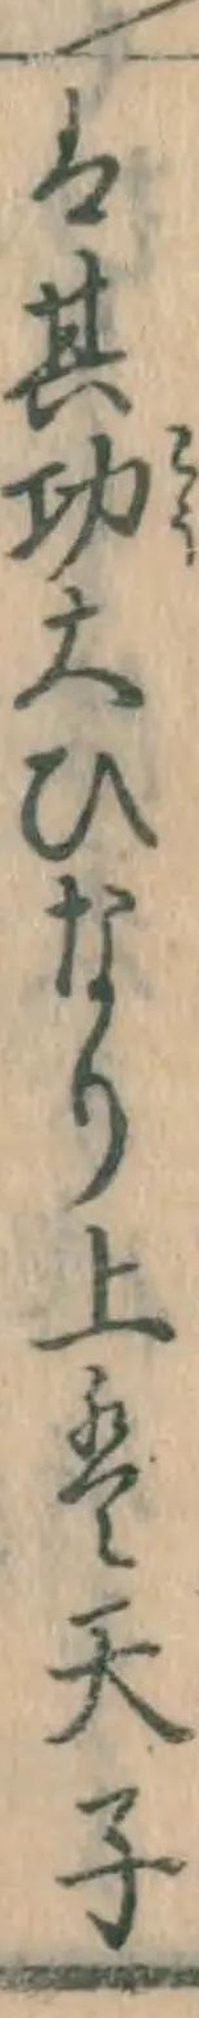は其功大ひなり上は天子
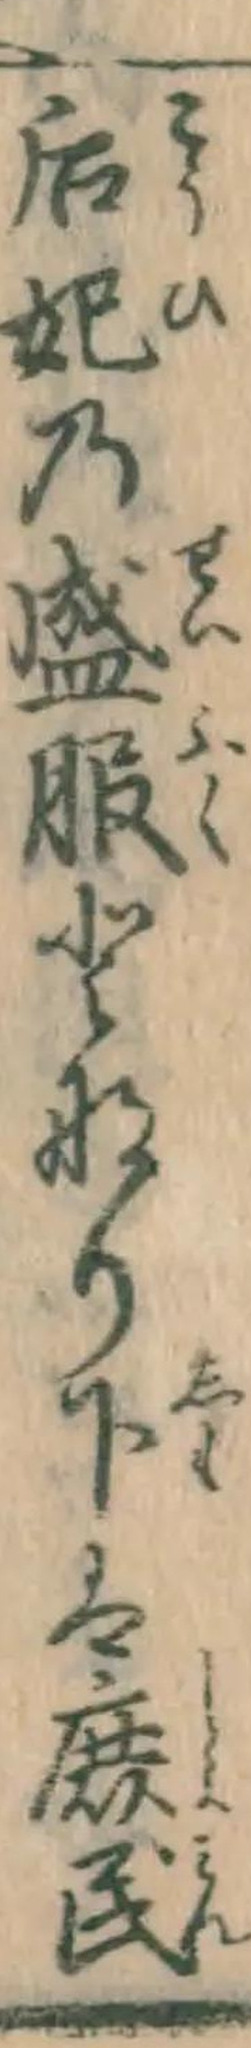后妃の盛服となり下は庶民
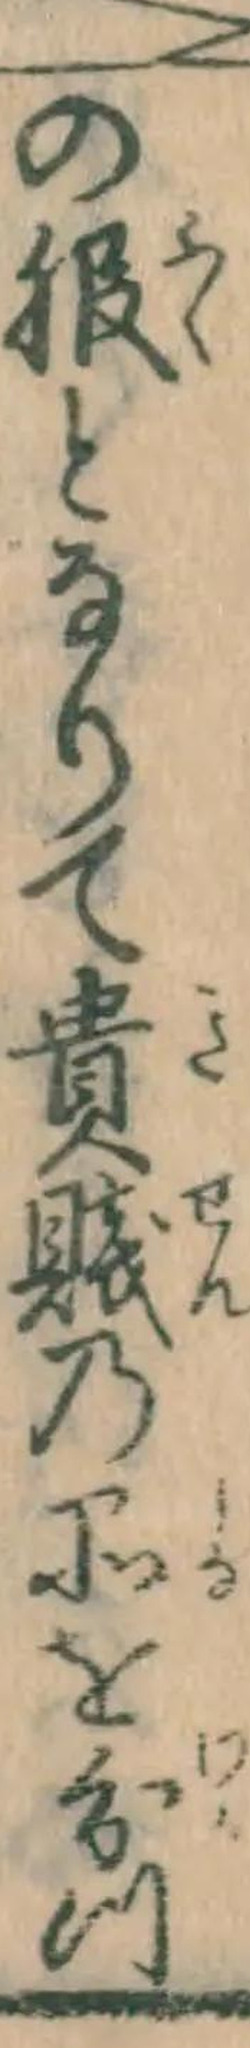の服となりて貴賤の品を分つ
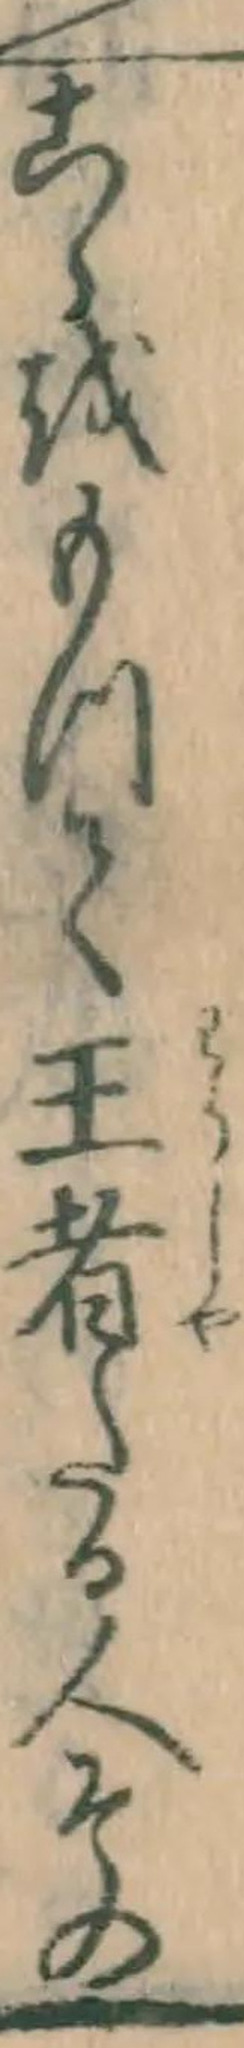こゝをもつて王者たる人その
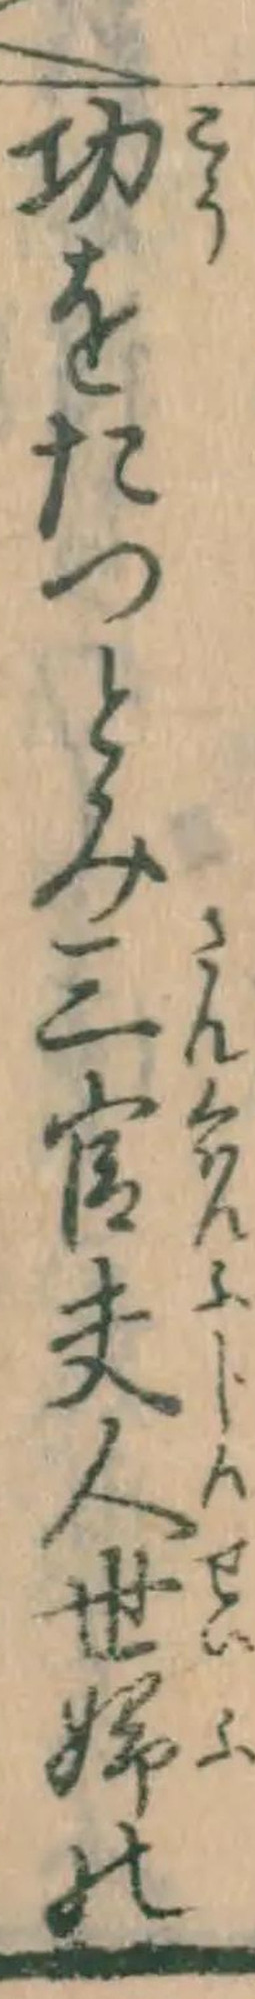功をたつとみ三官夫人世婦の
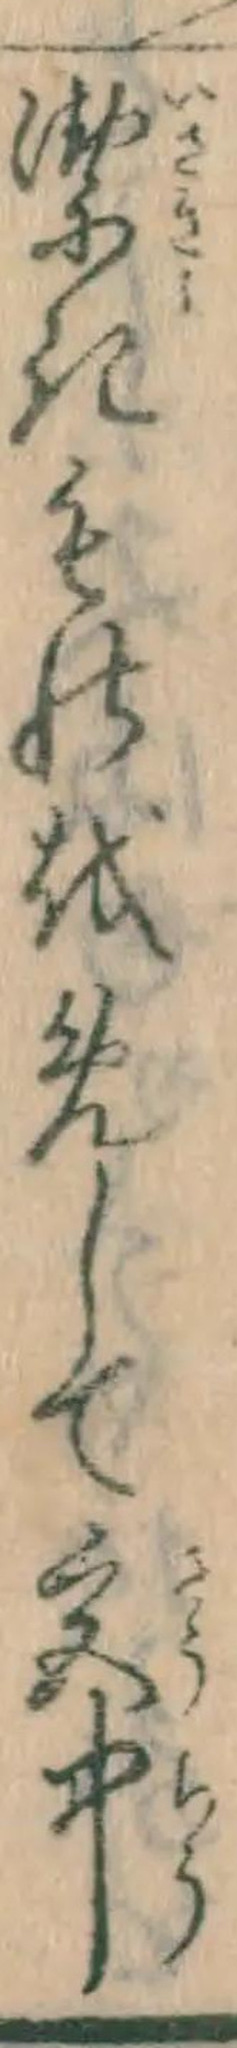潔きものをめして宮中
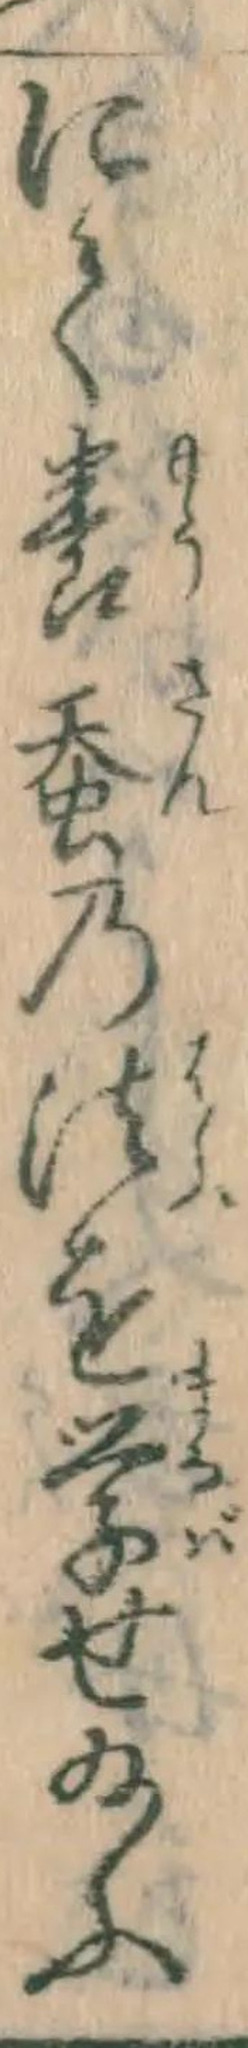にて養蚕の法を学せ給ふ
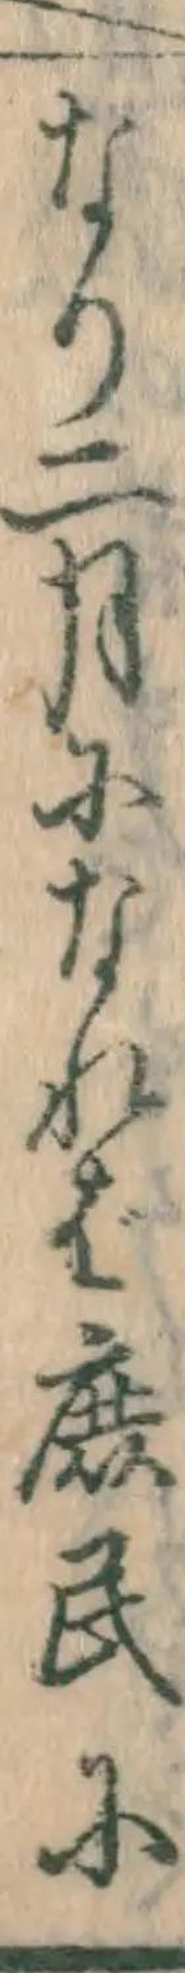なり二月になれば庶民に
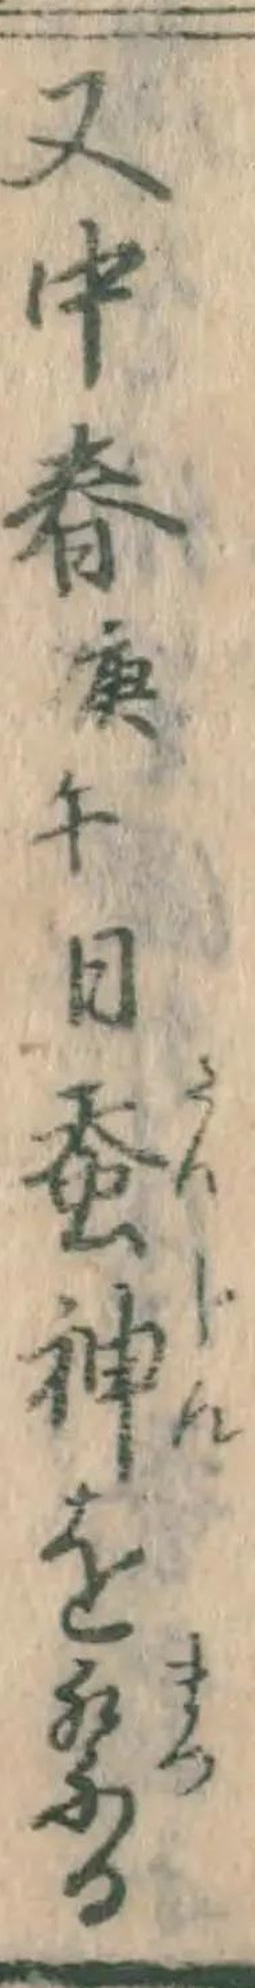又中春庚午日蚕神を祭る
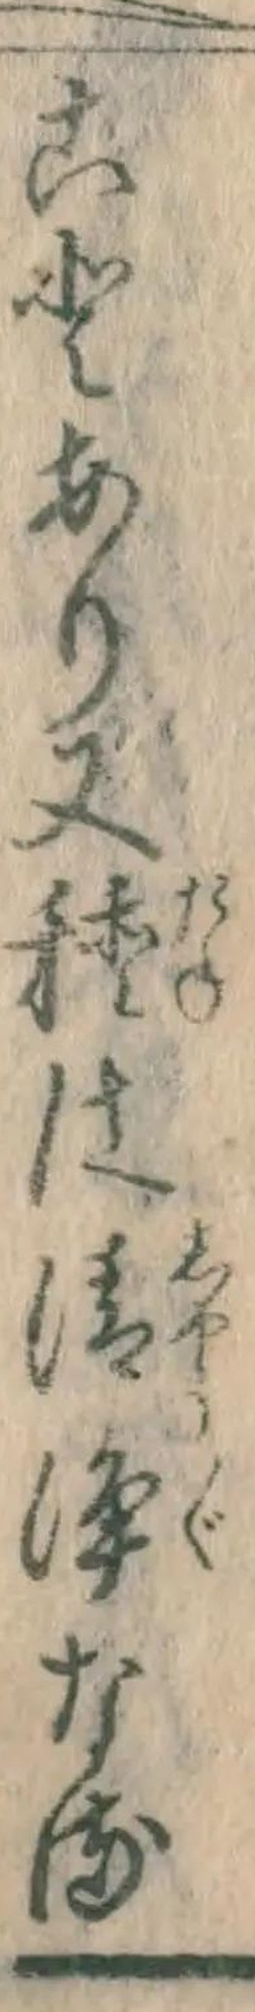ことあり又種は清浄なる
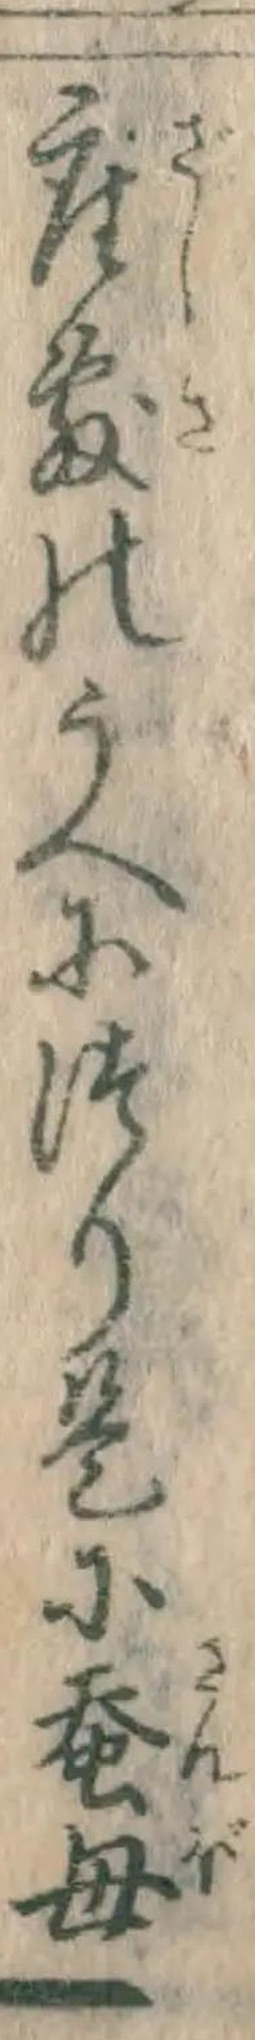座敷のうへにつり是に蚕母
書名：養蚕秘録 3巻. [1]
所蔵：国立国会図書館 National Diet Library, JAPAN
